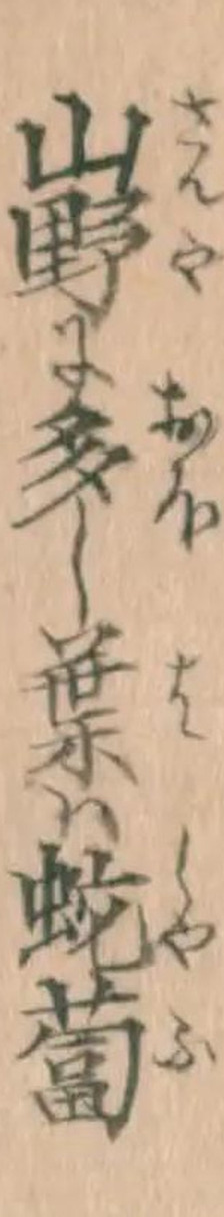山野に多し葉は蛇蔔
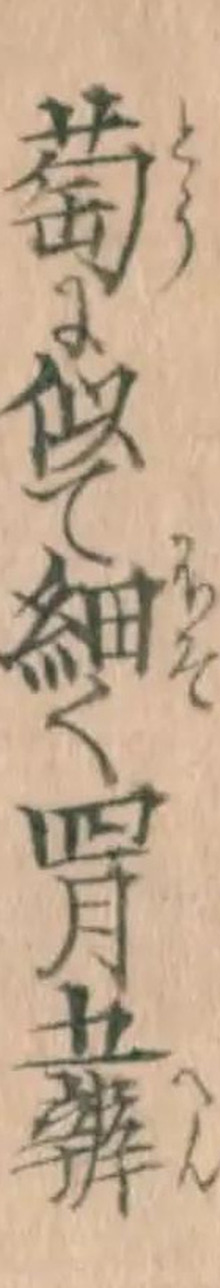萄に似て細く四月五弁
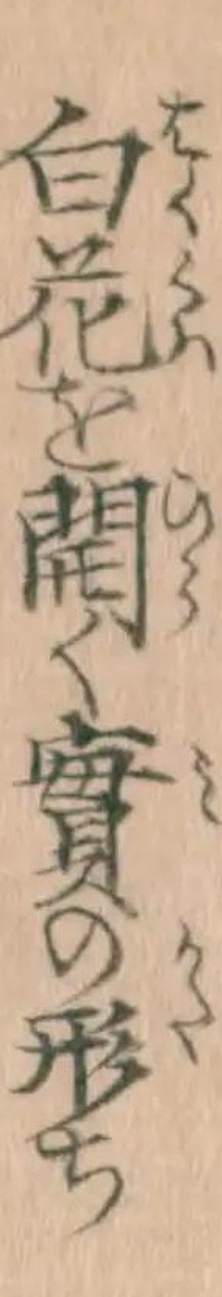白花を開く実の形ち
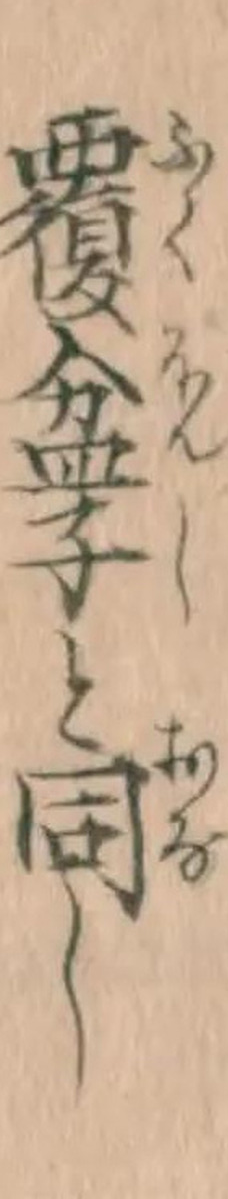覆盆子と同し
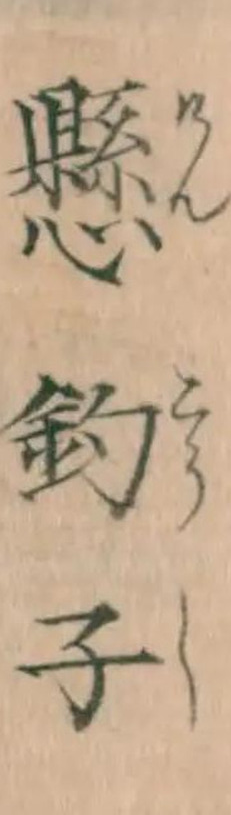懸釣子
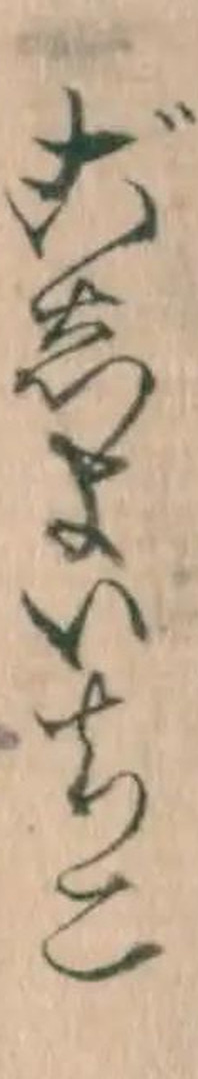ごしよいちこ
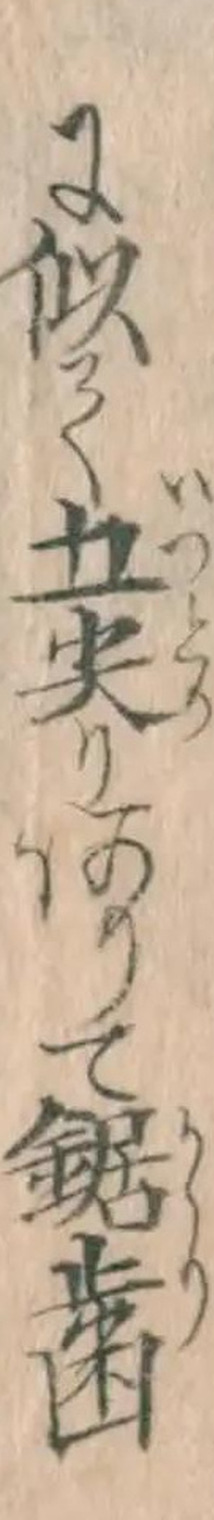に似て五尖りありて鋸歯
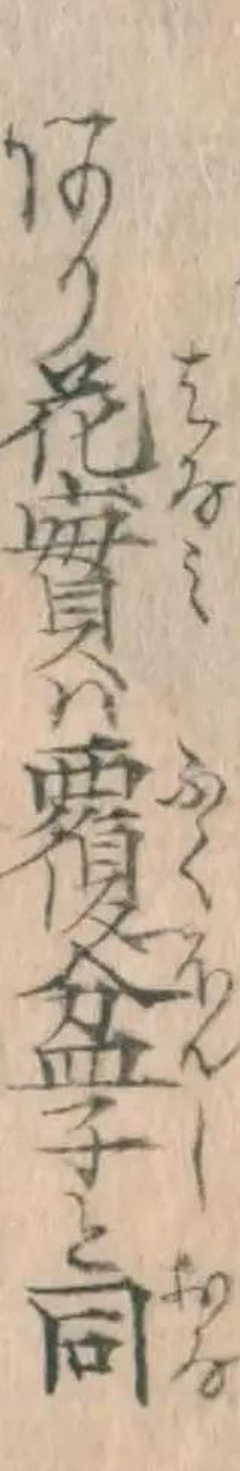あり花実は覆盆子と同

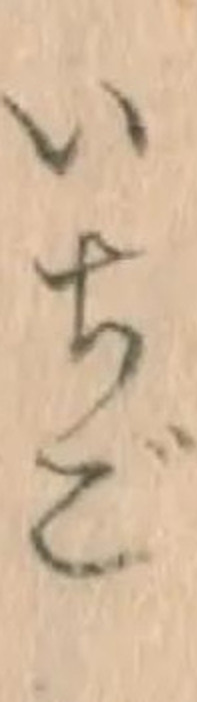いちご
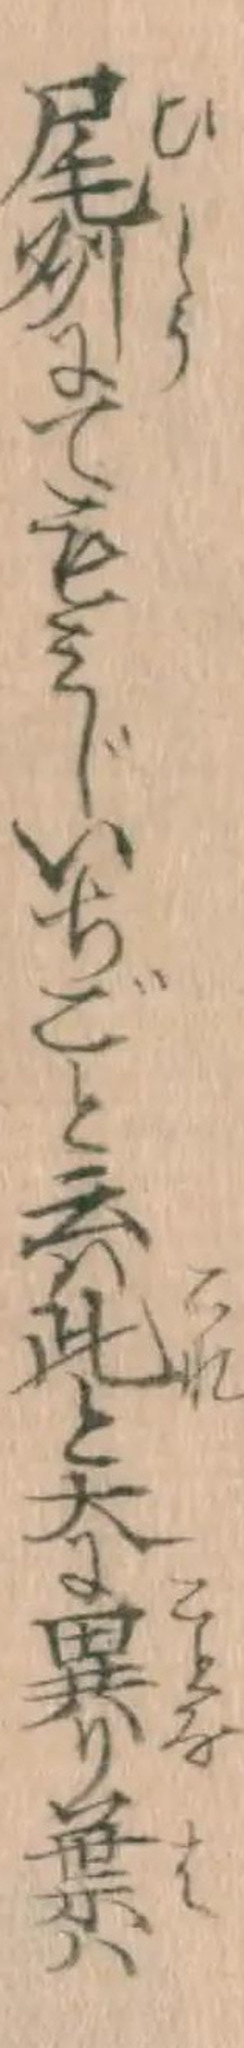尾州にてもみじいちごと云は此と大に異り葉は
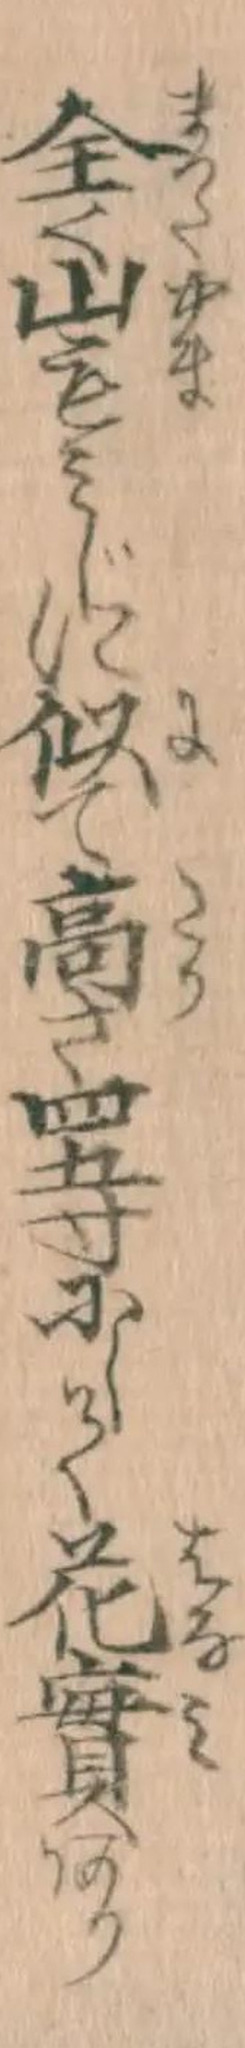全く山もみじに似て高さ四五寸にして花実あり
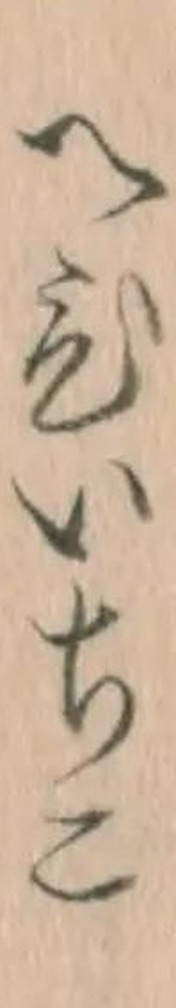へひいちこ
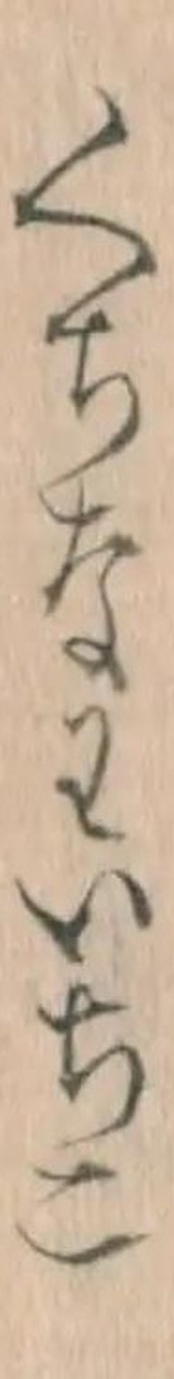くちなわいちこ
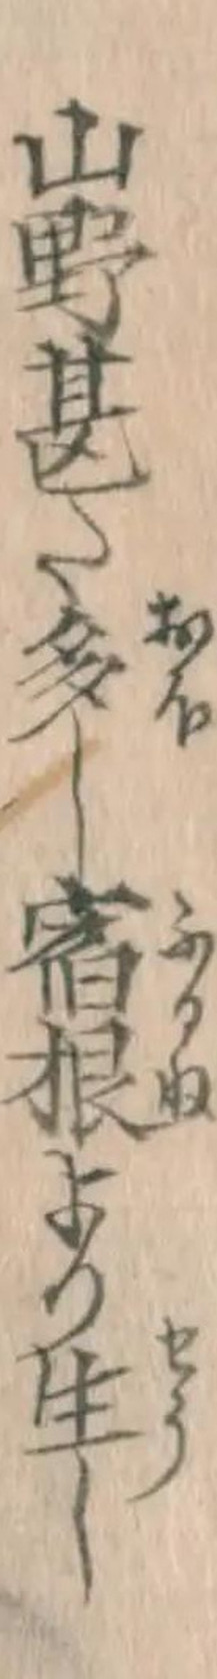山野甚た多し宿根より生し
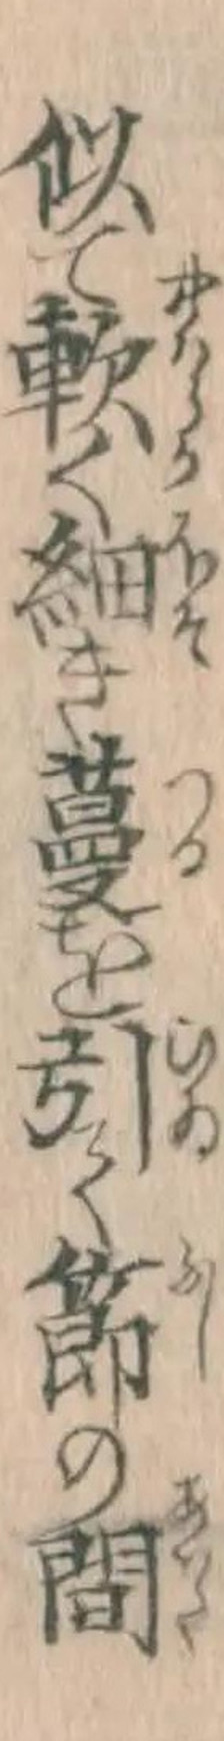似て軟く細き蔓を引て節の間
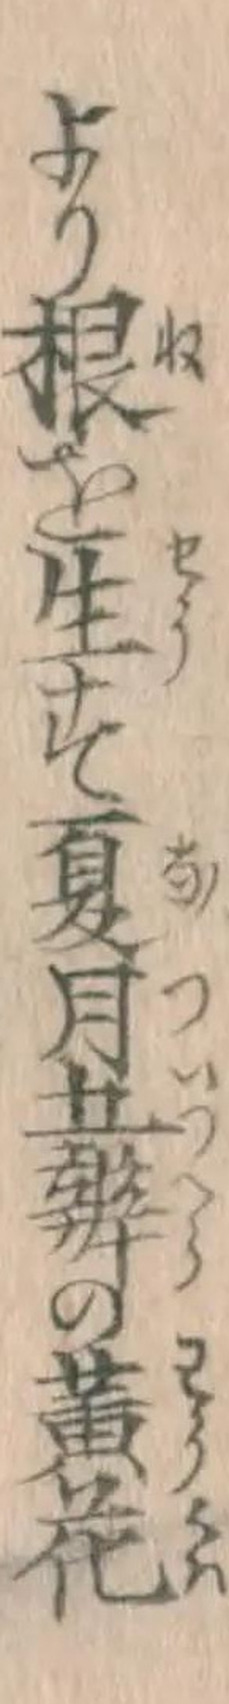より根を生す夏月五弁の黄花
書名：本草図譜. 巻25-27
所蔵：国立国会図書館 National Diet Library, JAPAN
